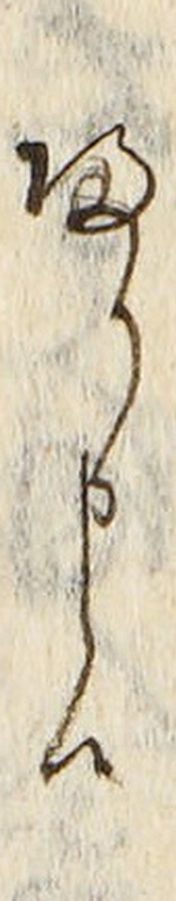帰り申候
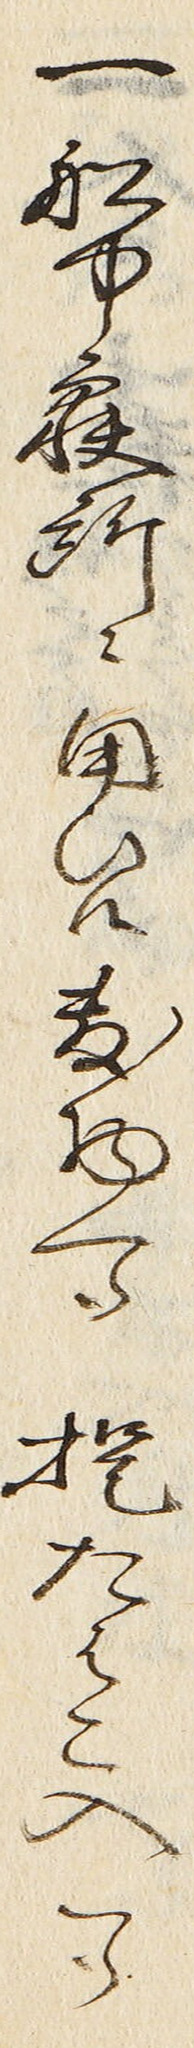一船中寝所に用ひ候敷物一ツ提たはこ入一ツ
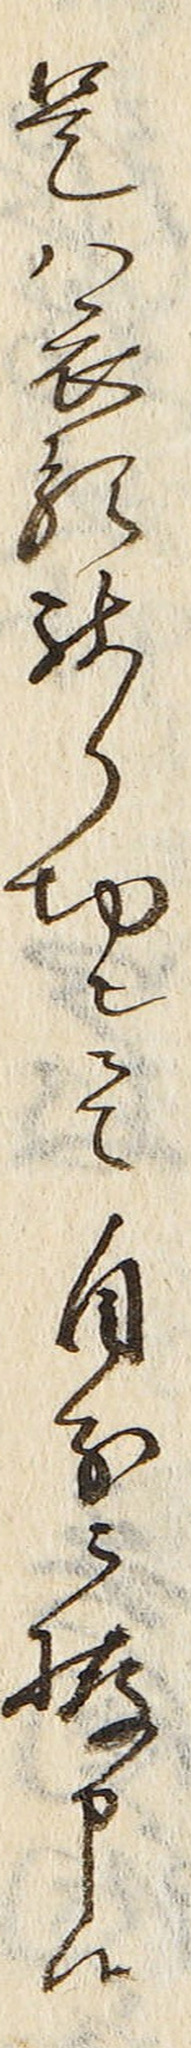是は衣類残り切れにて自分に拵申候
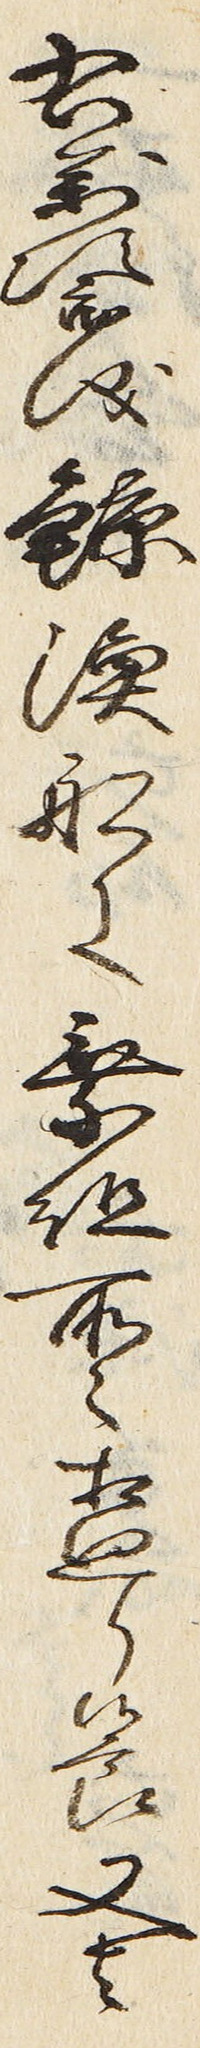右万次郎儀鯨漁船に乗組所々相廻り候節又は
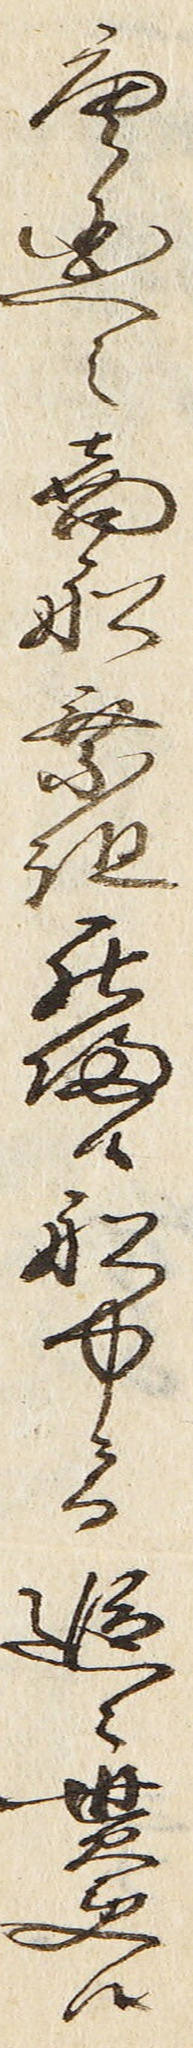唐国へ之商船乗組罷帰候船中に而追々貰受候
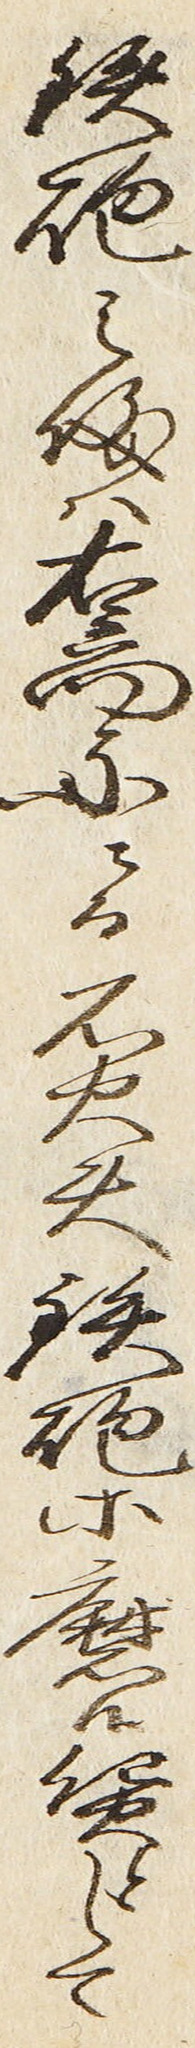鉄砲之儀は右商舟に而石火矢鉄砲等磨候賃として
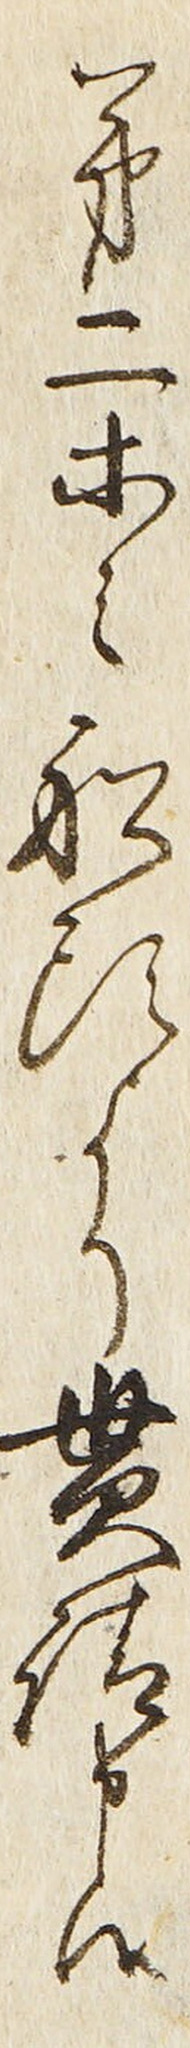第二等之船頭より貰請申候
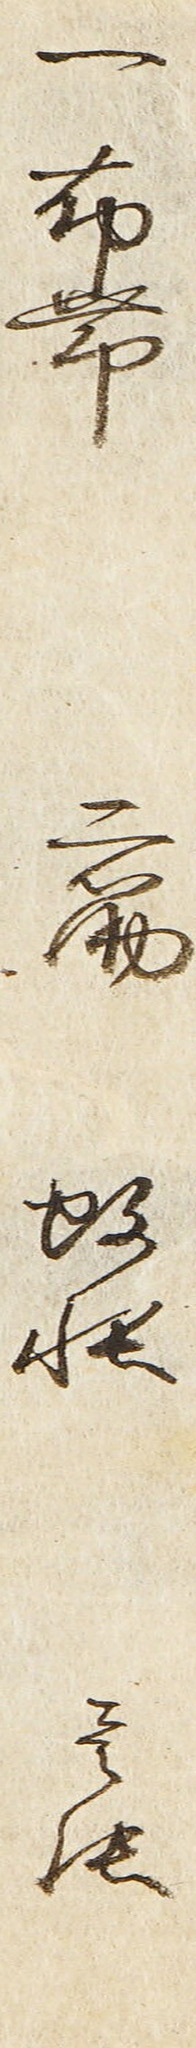一布帯二筋蚊帳壱張
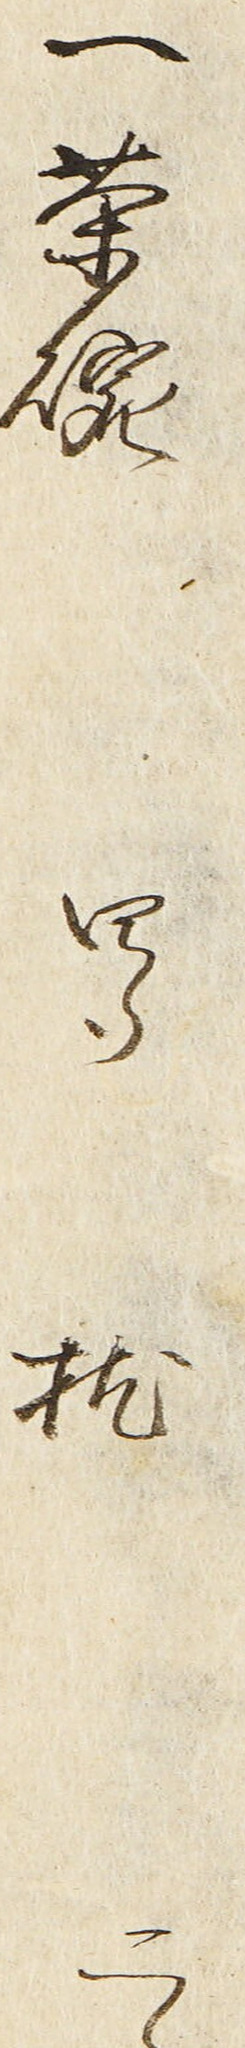一茶碗四ツ枕二ツ
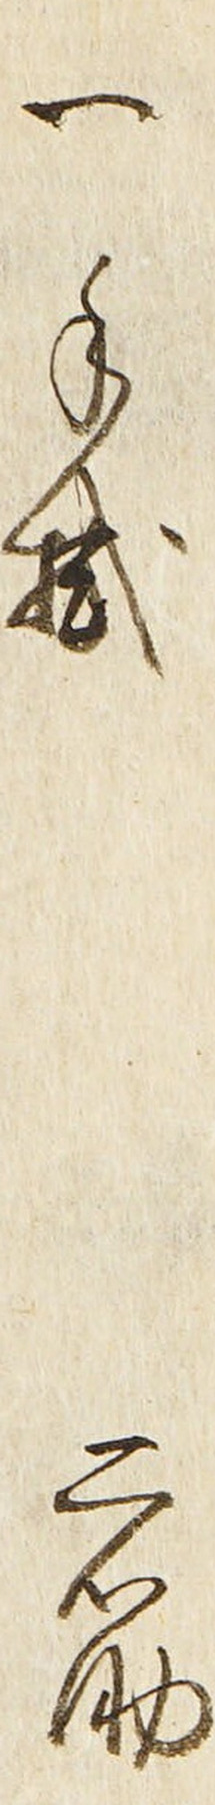一手拭二筋
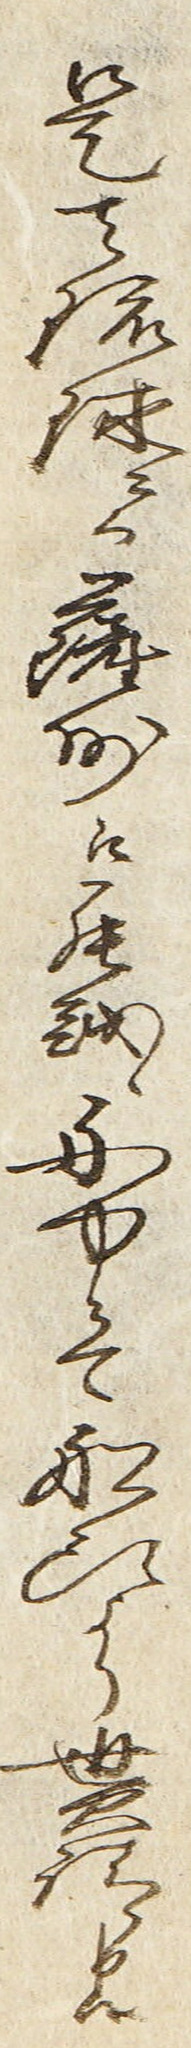是は琉球に而薩州え罷越候舟中にて船頭より貰請申候

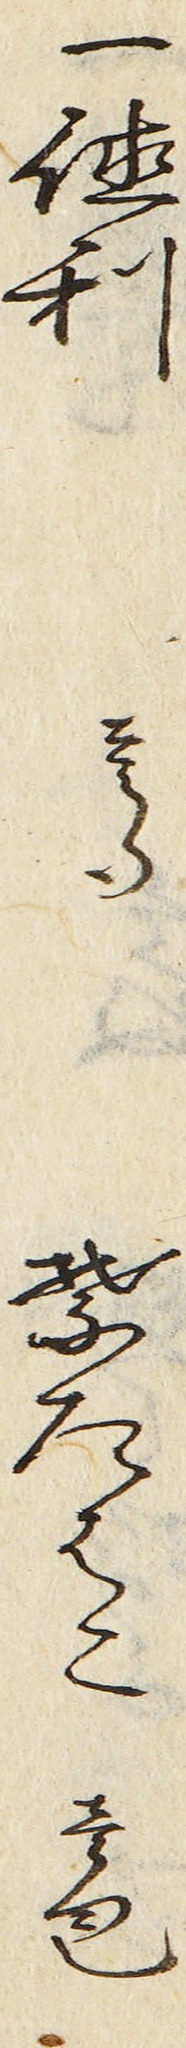一徳利壱ツ葉たはこ壱包
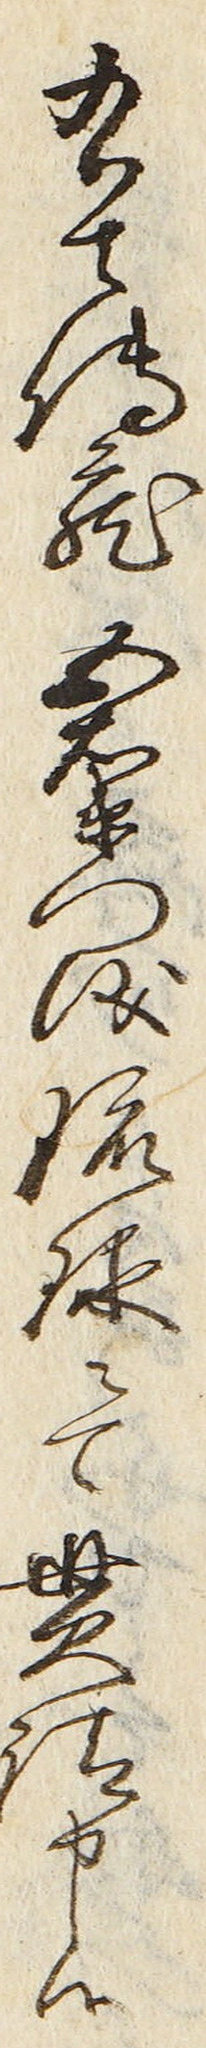右は伝蔵五右衛門儀琉球にて貰請申候
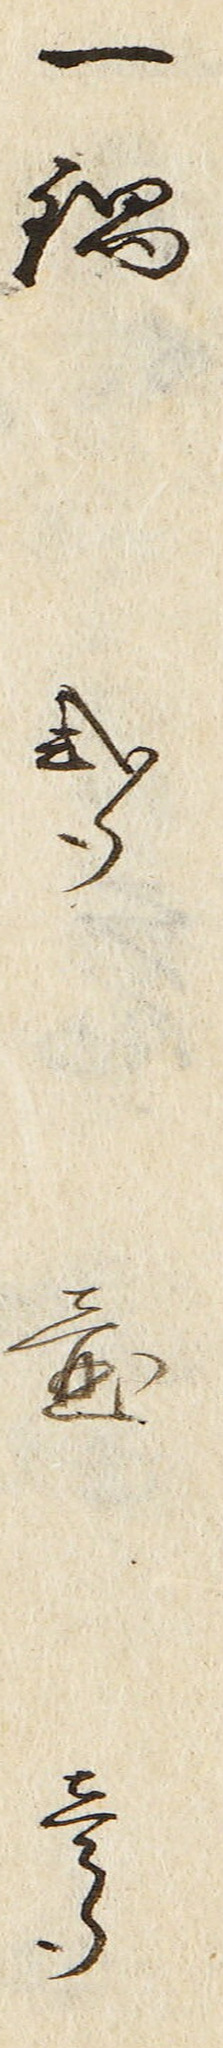一鍋弐ツ壺壱ツ
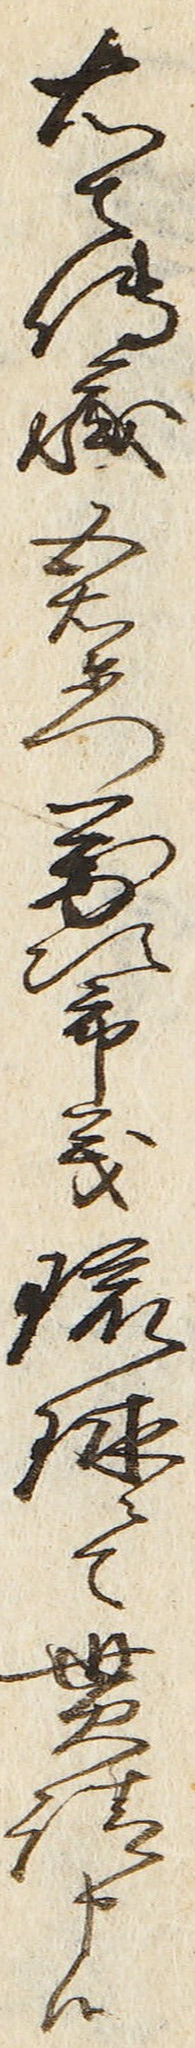右は伝蔵五右衛門万次郎義琉球にて貰請申候
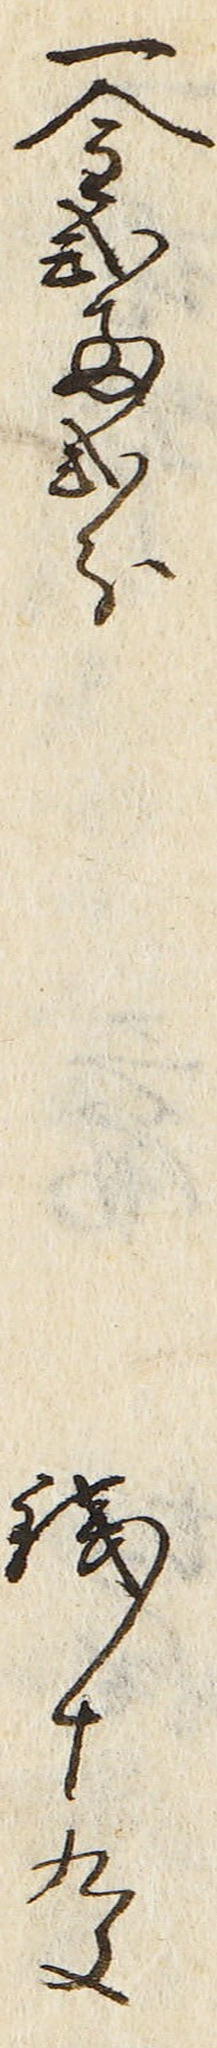一金弐両弐分銭十九文
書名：土佐中浜万次郎漂流記
